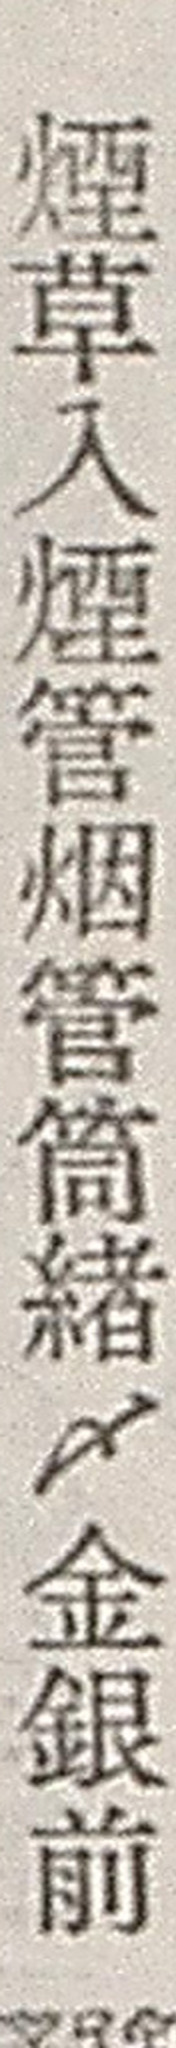煙草入煙管烟管筒緒〆金銀前
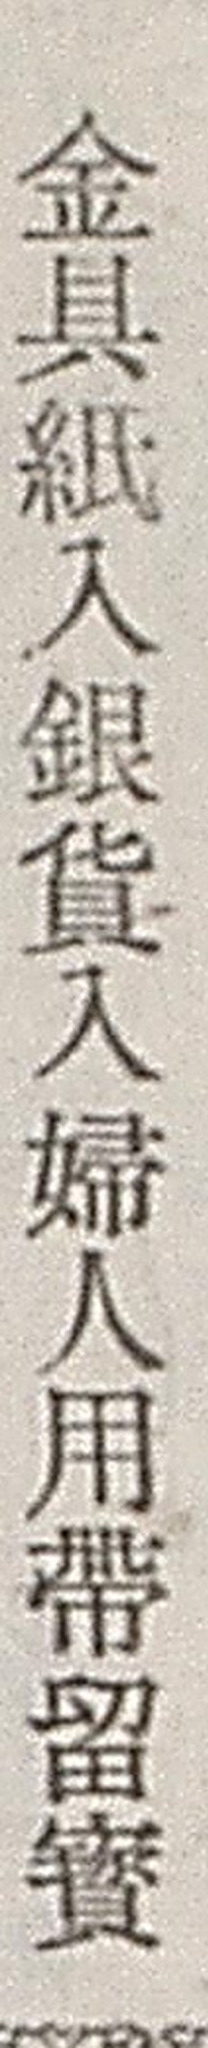金具紙入銀貨入婦人用帯留宝
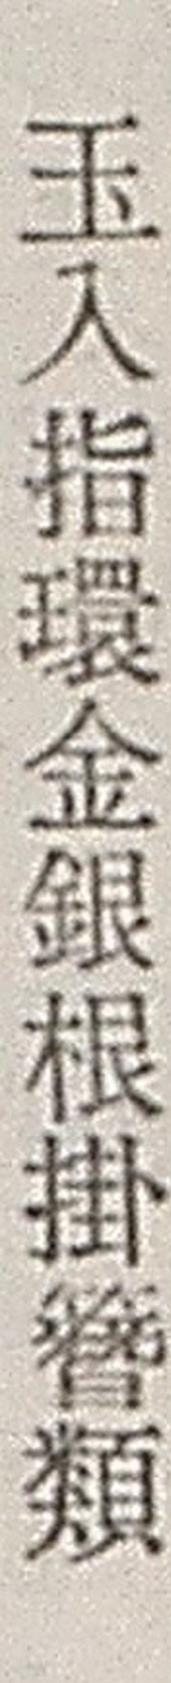玉入指環金銀根掛簪類
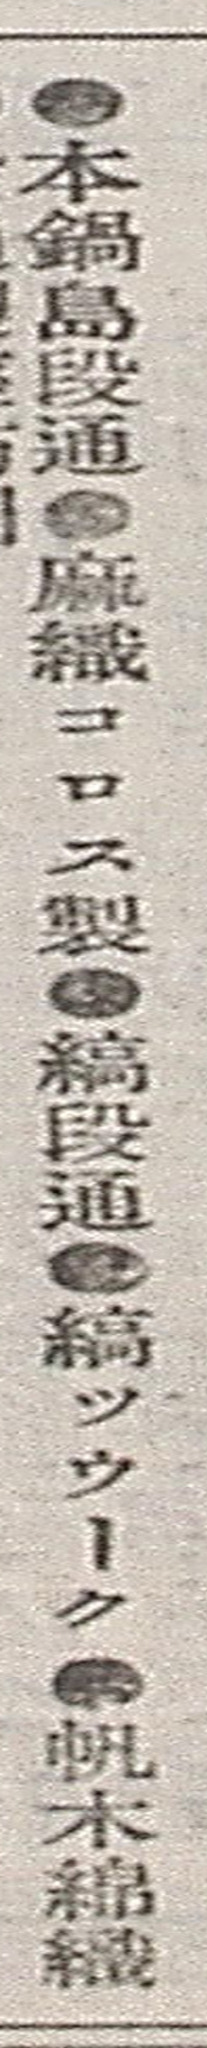●本鍋島段通●麻織コロス製●縞段通●縞ツーク●帆木綿織
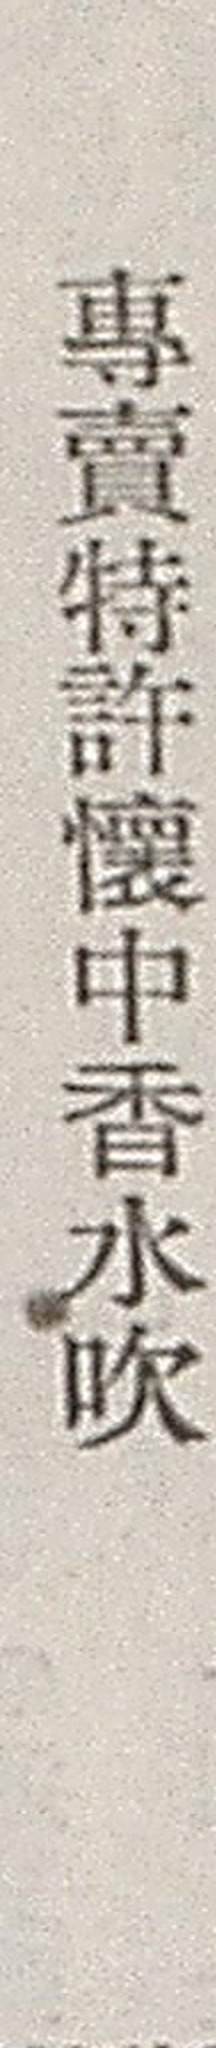専売特許懐中香水吹
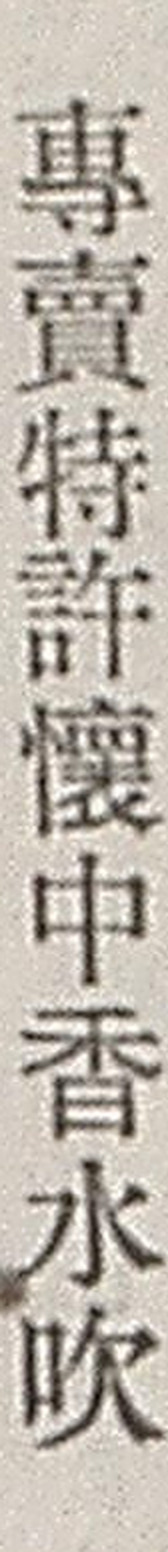専売特許懐中香水吹
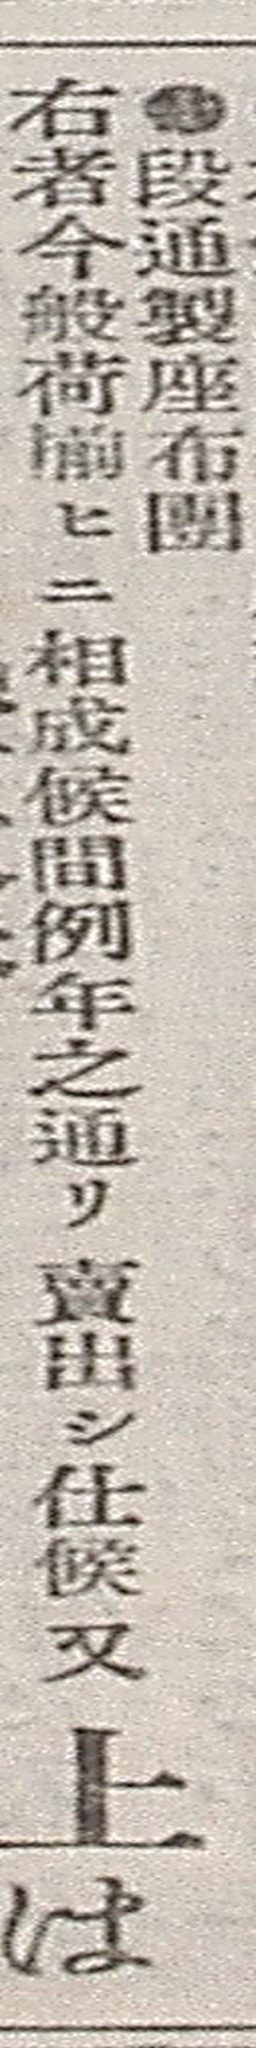右者今般荷揃ヒ二相成候間例年之通リ売出シ仕候又上は
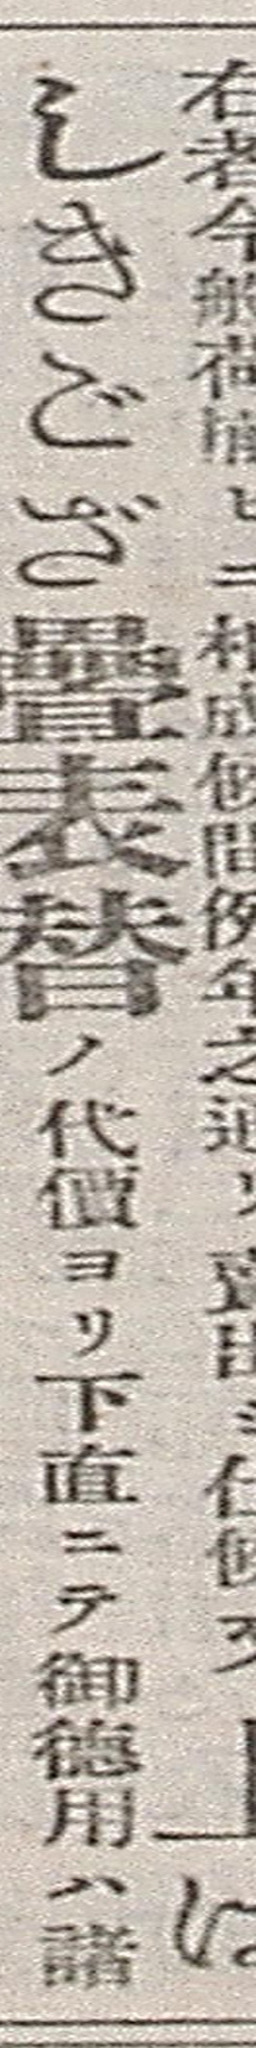しきござ畳表替ノ代価ヨリ下値ニテ御徳用ハ諸
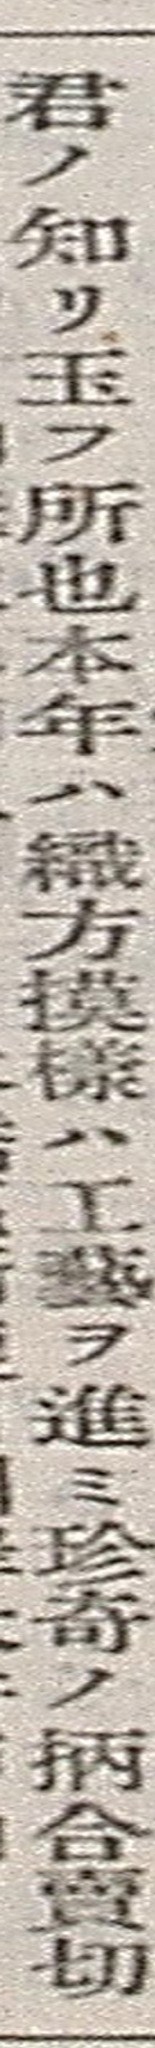君ノ知リ玉フ所也本年ハ織方模様ハ工芸ヲ進ミ珍奇ノ柄合売切
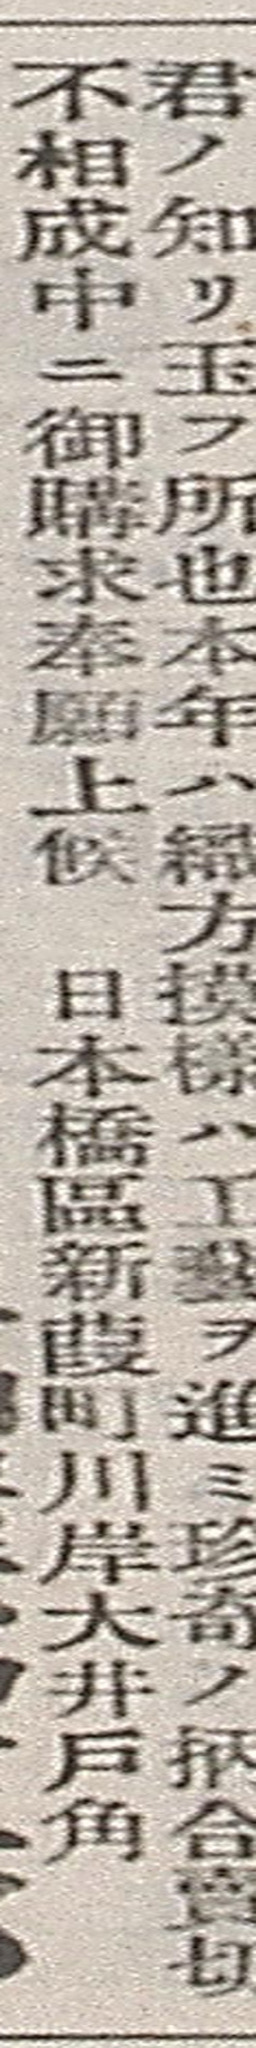不相成中二御購求奉願上候日本橋區葭町河岸大井戸角
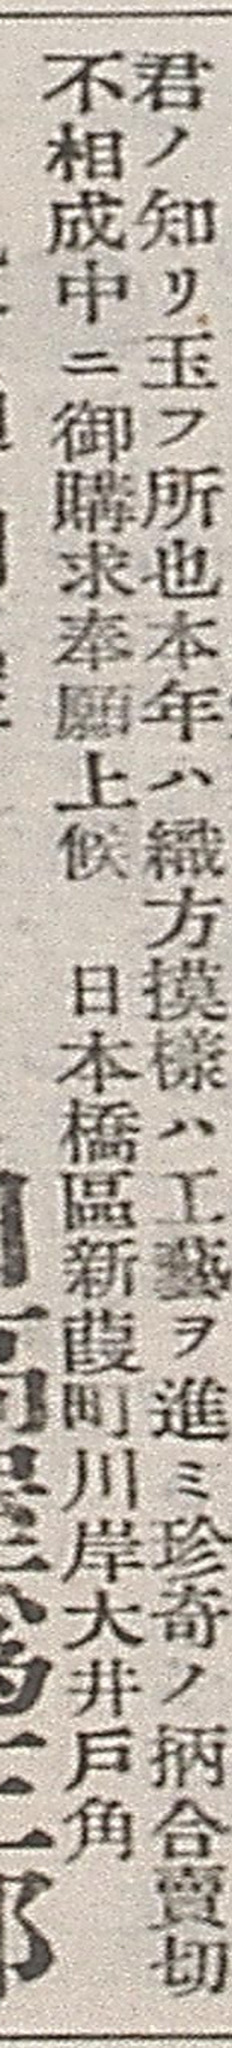不相成中二御購求奉願上候日本橋區葭町河岸大井戸角
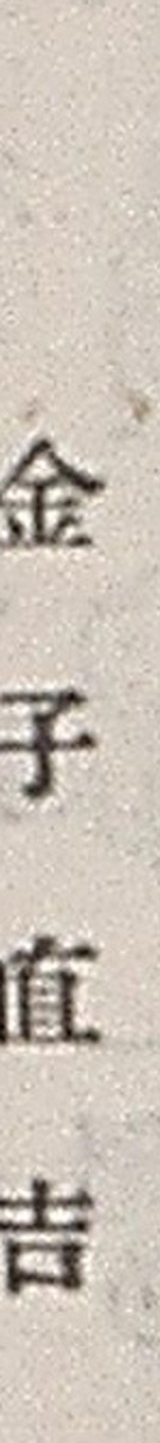金子直吉
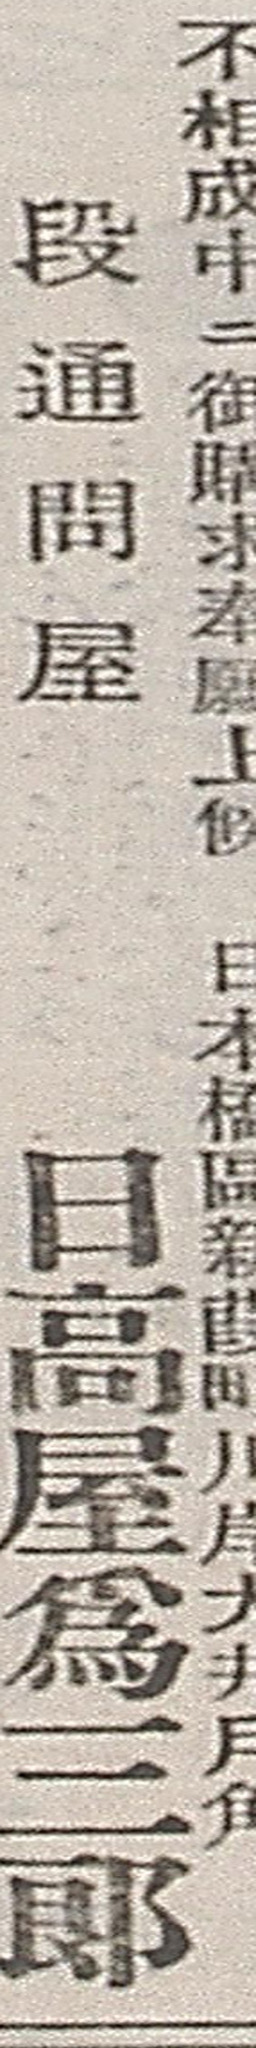段通問屋日高屋為三郎
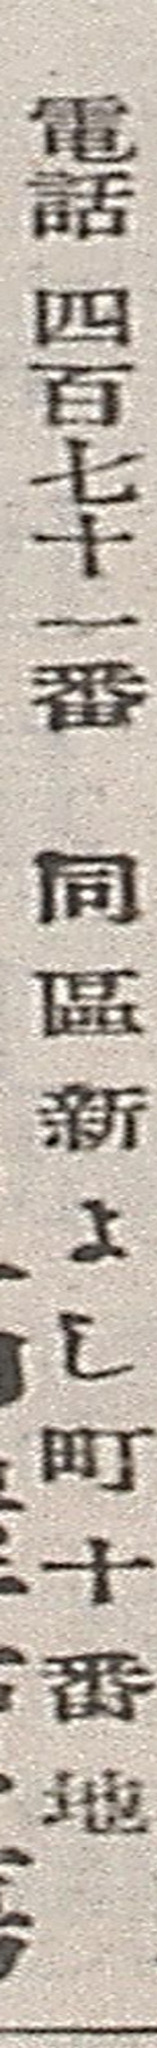電話四百七十一番同區新よし町十番地
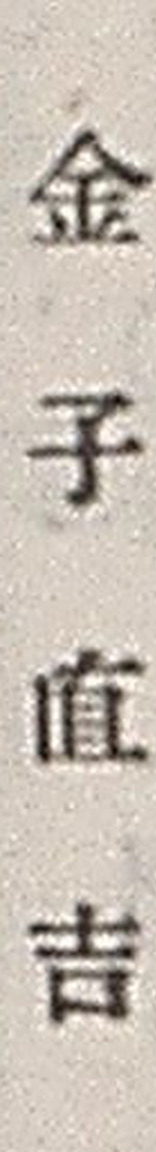金子直吉
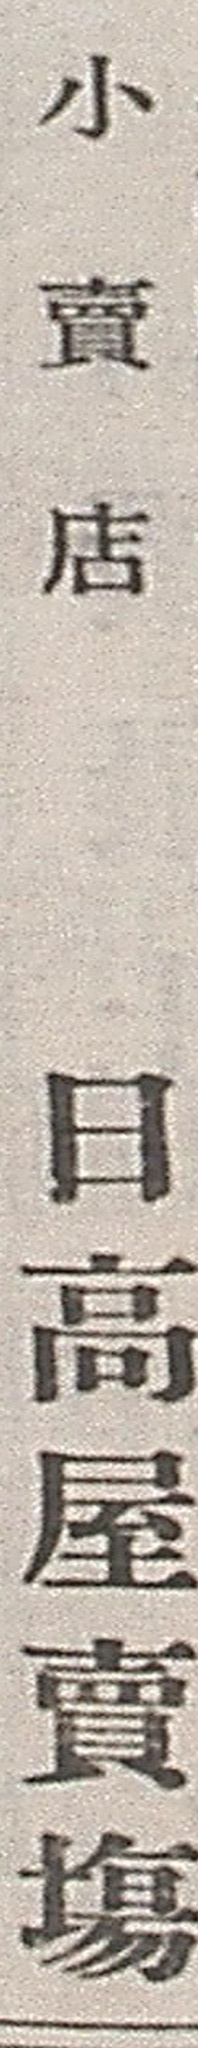小売店日高屋売場
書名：風俗畫報臨時増刊第百二十六號　洪水被害録（中）
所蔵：東京大学地震研究所図書室 Earthquake Research Institute Library, The University of Tokyo, JAPAN
